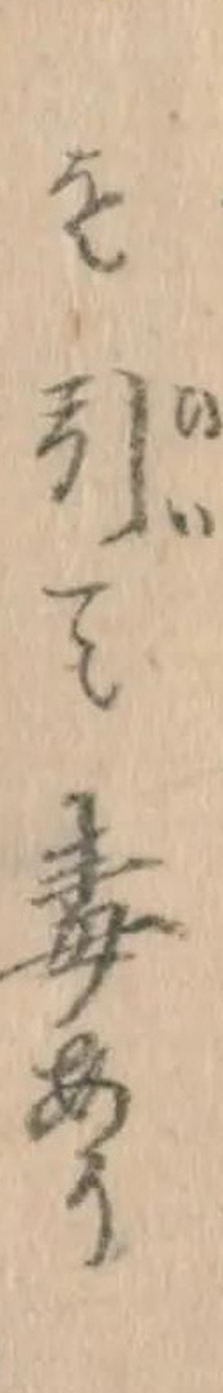を引て毒あり
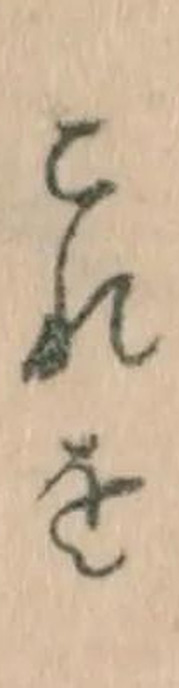これを
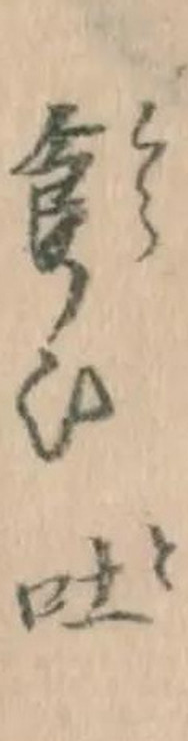食ひ吐
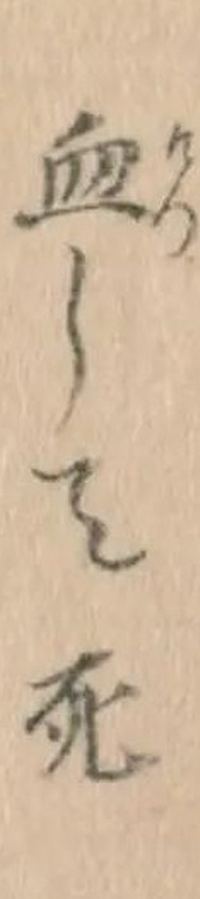血して死
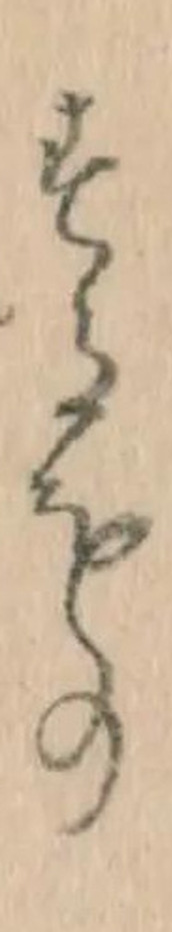するもの
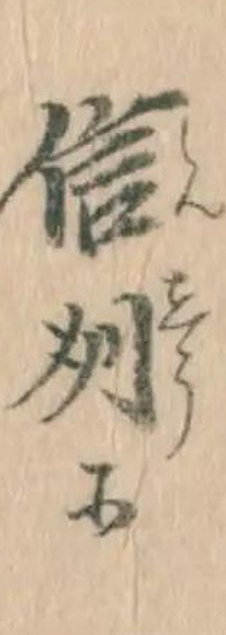信州に
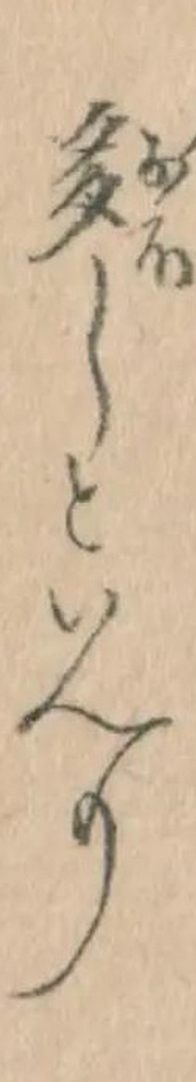多しといへり

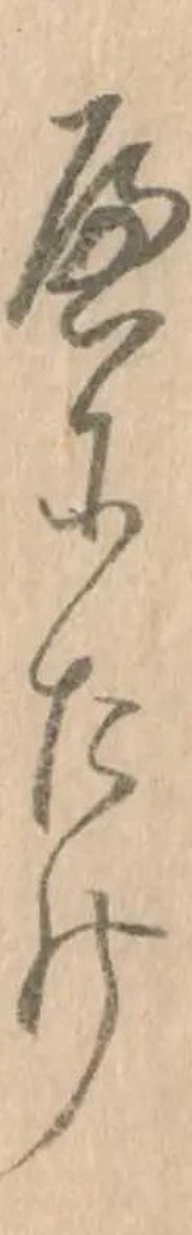へにたけ
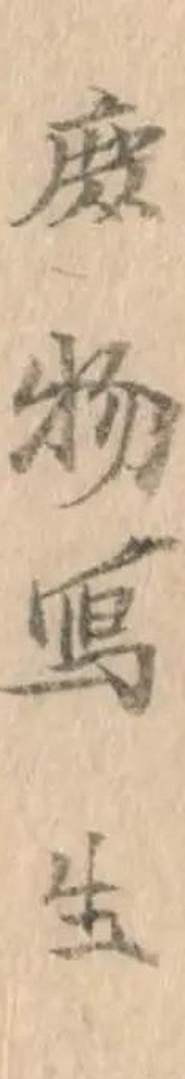庶物写生
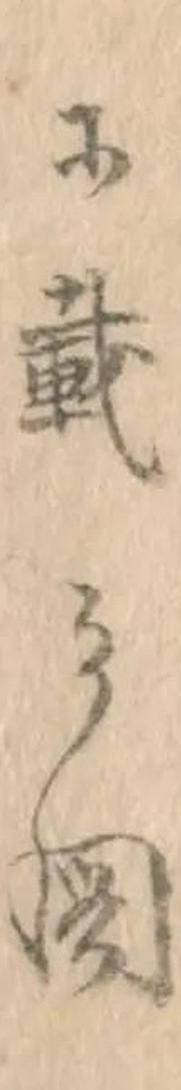に載る図
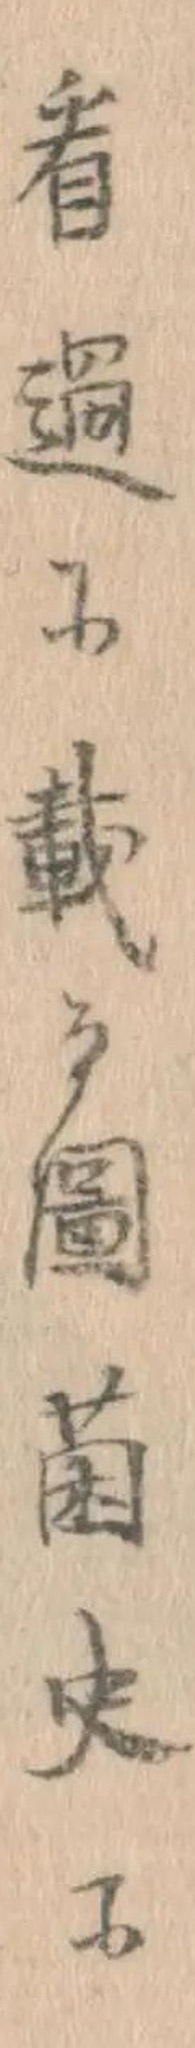看過に載る図菌史に
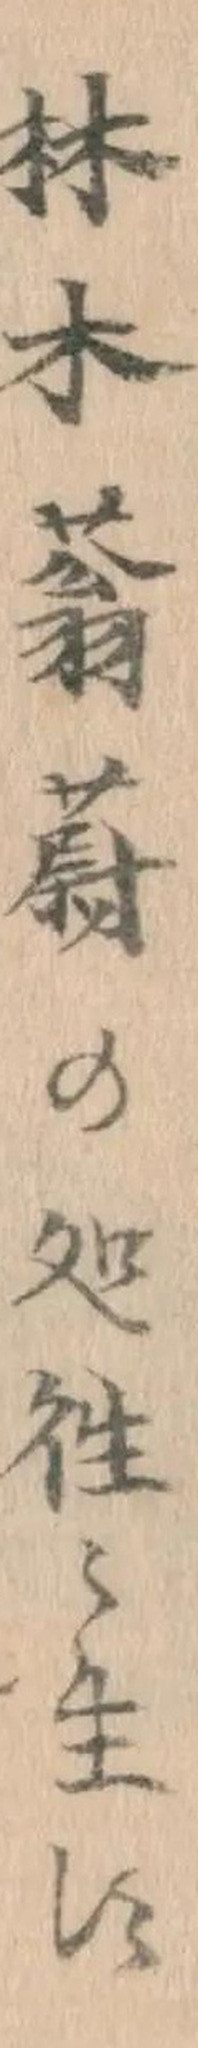林木蓊蔚の処往々生す
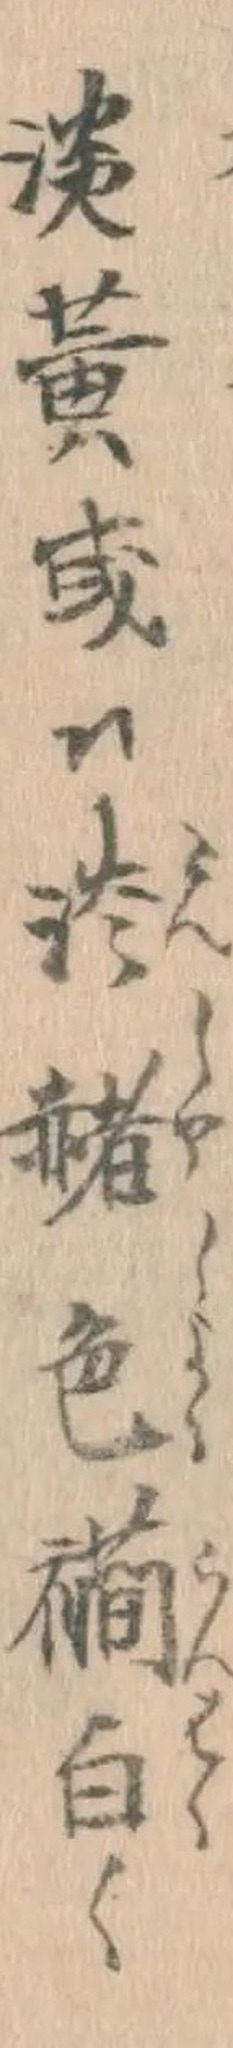淡黄或は淡赭色白く
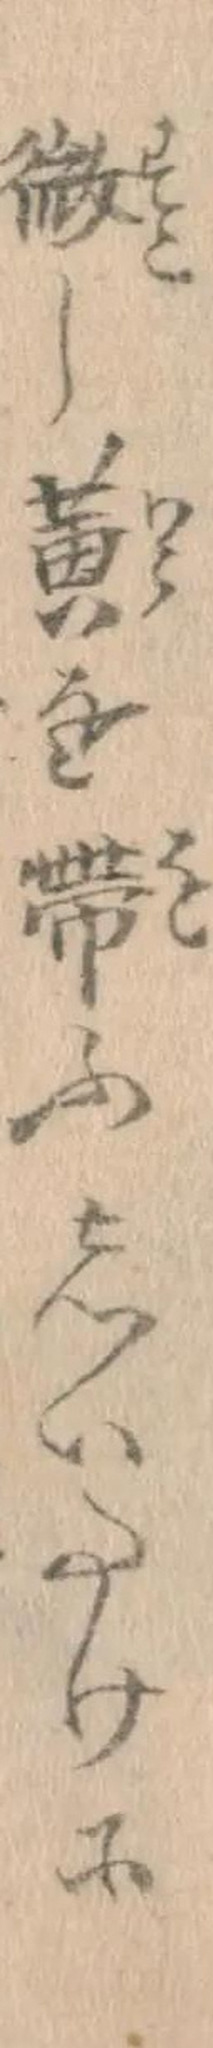微し黄を帯ふしいたけに
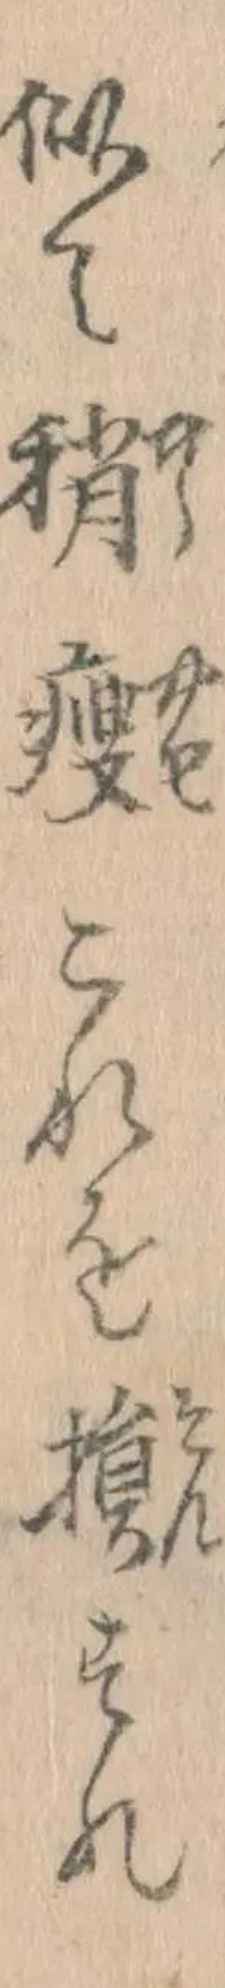似て稍痩これを損すれ
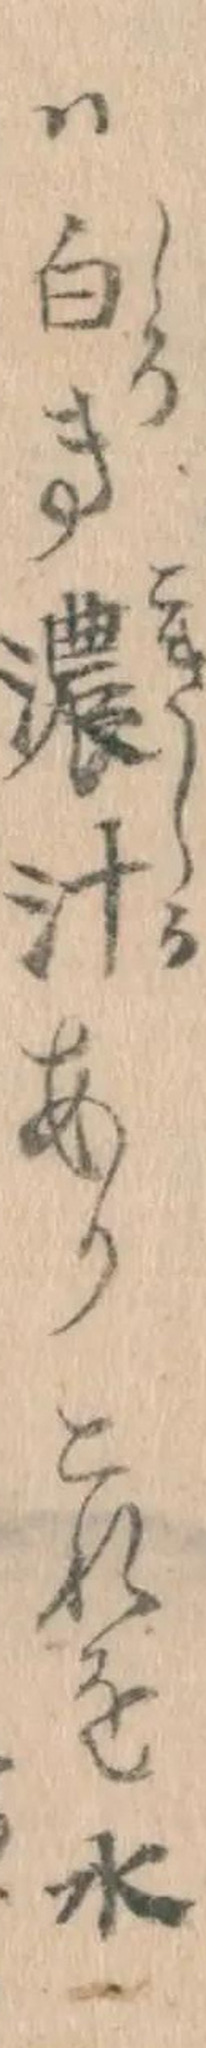は白き濃汁ありこれを水
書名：本草図譜. 巻58-60
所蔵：国立国会図書館 National Diet Library, JAPAN
